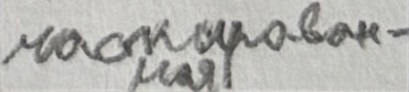маскирован-ная
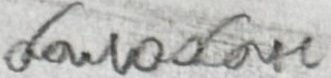балобан
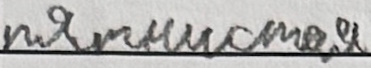пятнистая
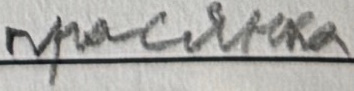просянка
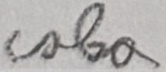сова
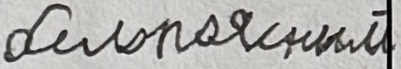белопоясный
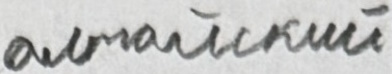алтайский
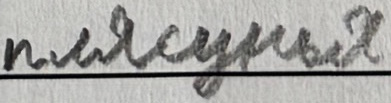плясунья
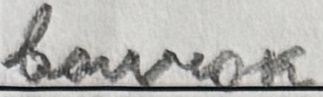волчок
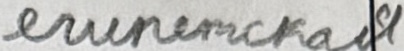египетская
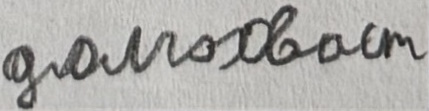долгохваст
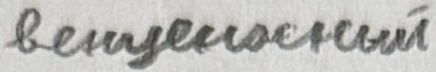венценосный
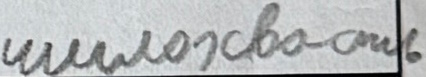шилохвость
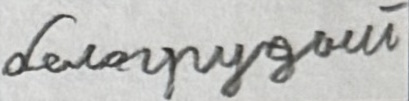белогрудый
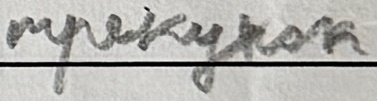трекунок
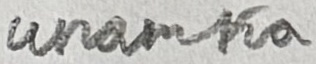ипатка
